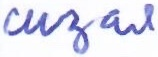сизая
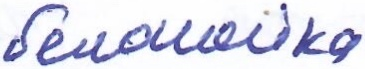белошейка
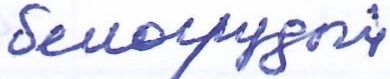белогрудый
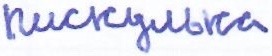пискулька
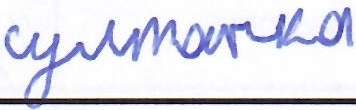султанка
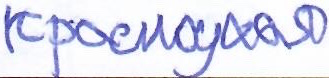красноухая
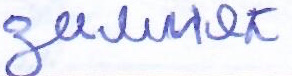зимняк
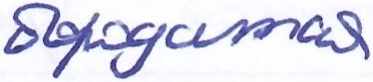бородатая
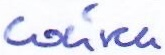сойка
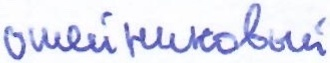ошейниковый
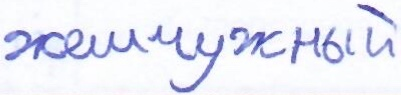жемчужный
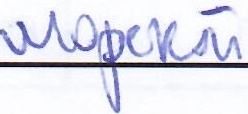морскй
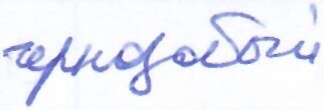чернозобый
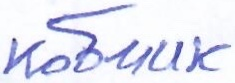кобчик
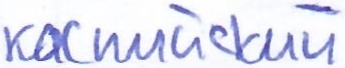каспийский
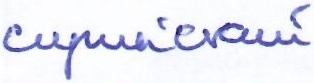сирийский
